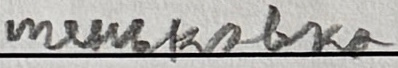теньковка
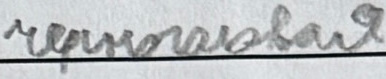черноголовая
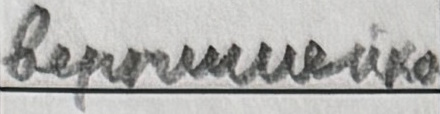вертишейка
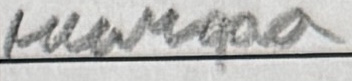нимфа
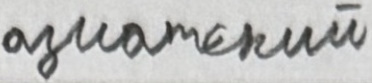азиатский
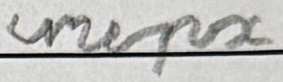стерх
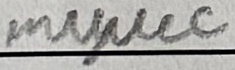тулес
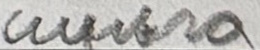синьга
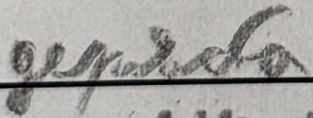деряба
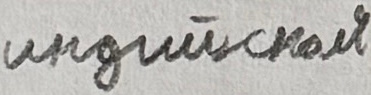индийская
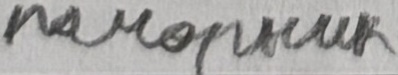паморник
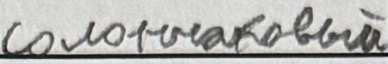солончаковый
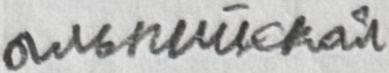альпийская
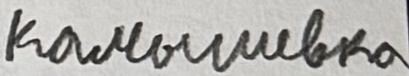камышевка
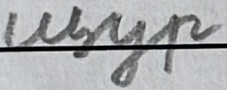щур
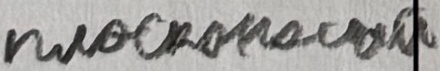плосконосый
